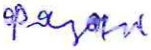фязан
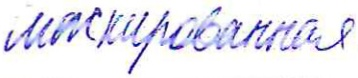маскированная
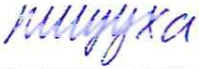пищуха
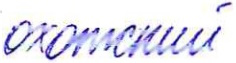охотский
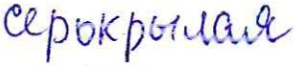серокрылая
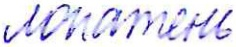лопатень
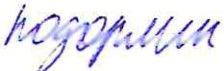подорлик
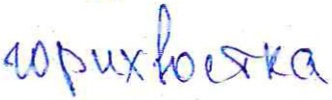горихвостка
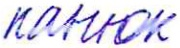канюк
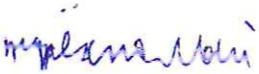трёхпалый
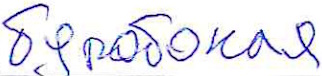буробокая
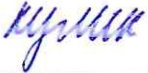кулик
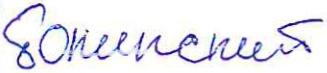бонинский
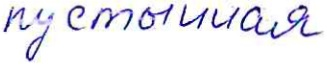пустынная
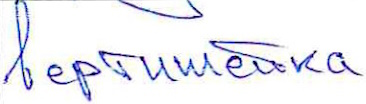вертишейка
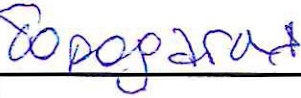бородатая
